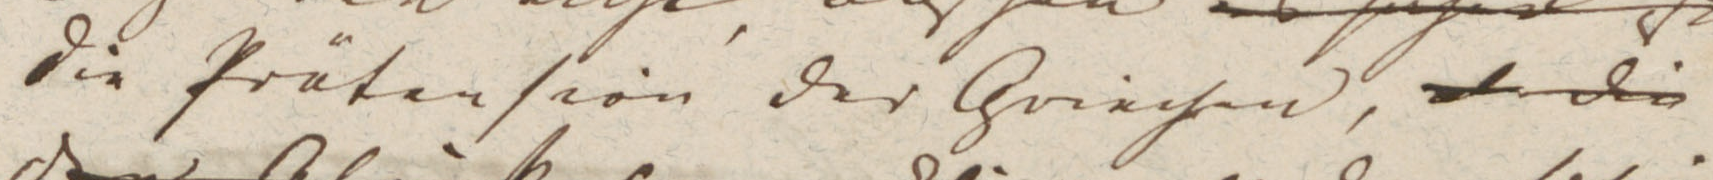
die Prätension der Griechen, d die
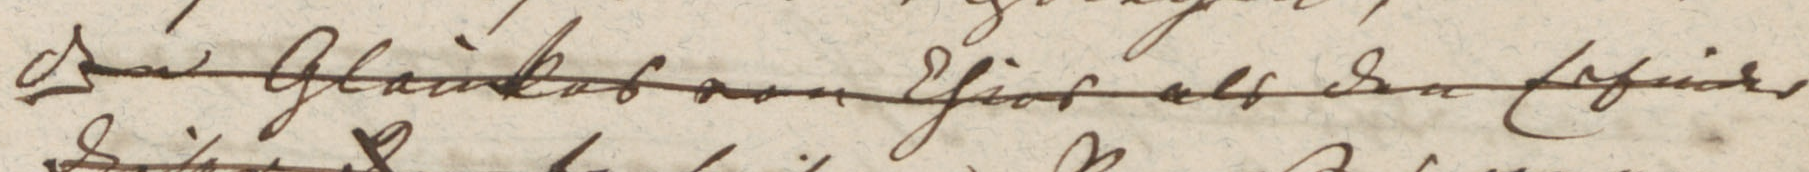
den Glaukos von Chios als den Erfinder
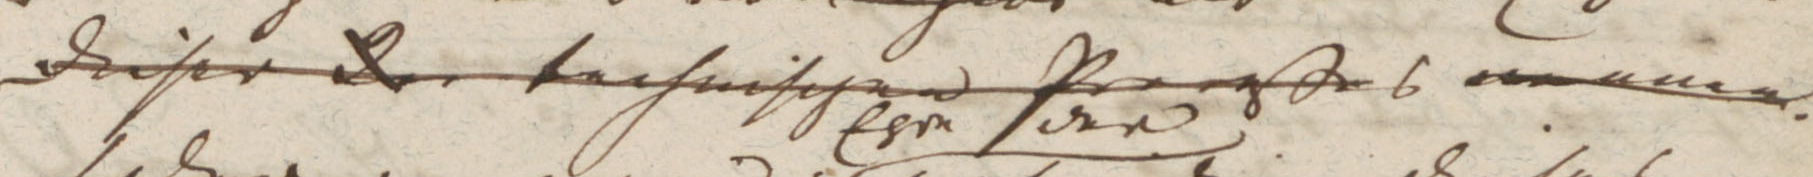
dieser K technischen Processes nennen.
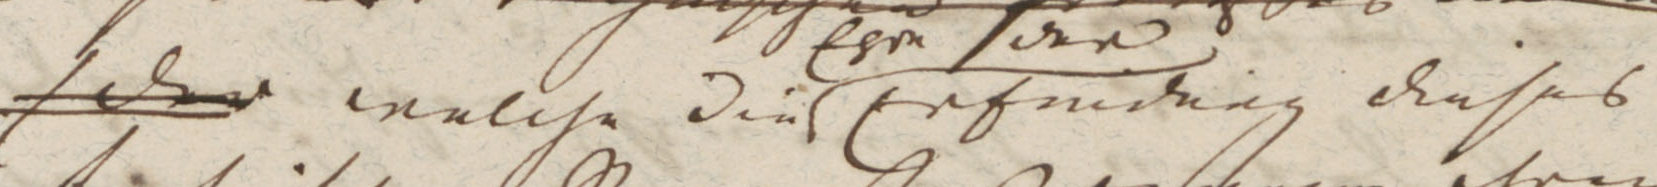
(der welche die Ehre der Erfindung dieses
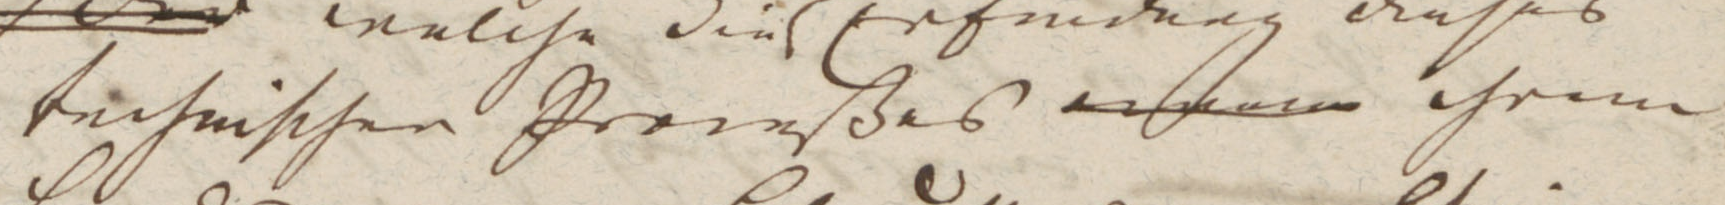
technischen Processes einem ihrem
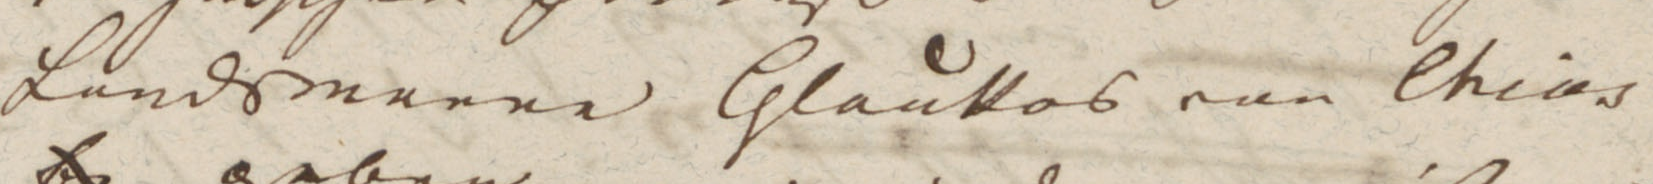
Landsmanne Glaukos von Chios
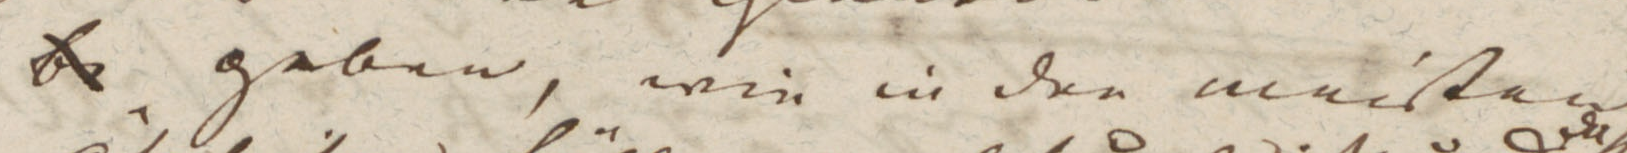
b geben, wie in den meisten
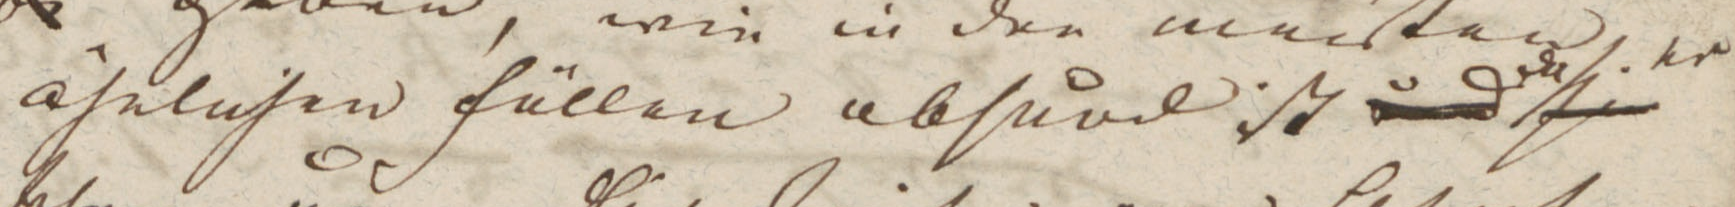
ähnlichen Fällen absurd ist und da sie er
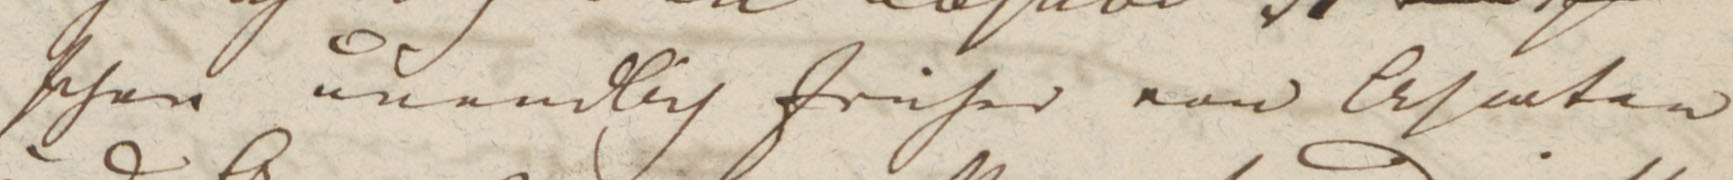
schon unendlich früher von Asiaten
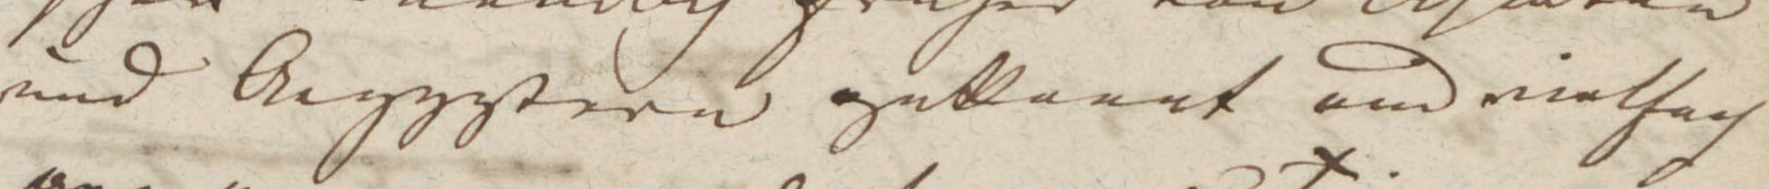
und Aegyptern gekannt und vielfach
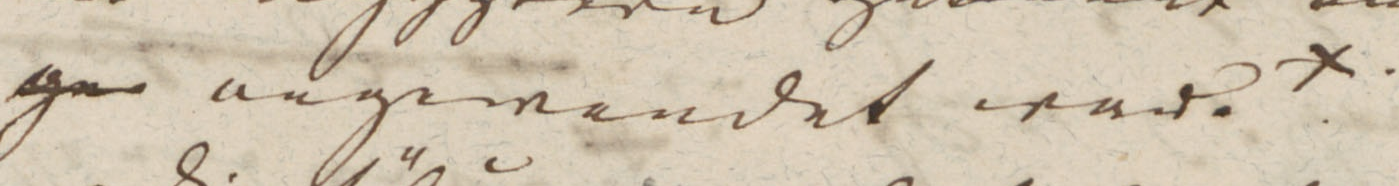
ge angewendet war. %
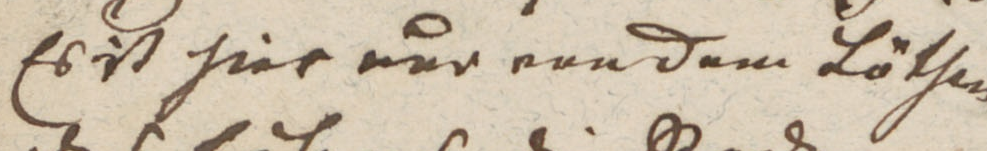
Es ist hier nur von dem Löthen
